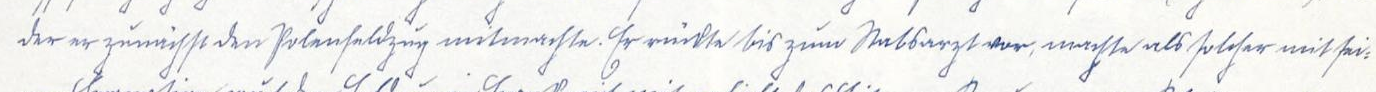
der er zunächst den Polenfeldzug mitmachte. Er rückte bis zum Stabsarzt vor, machte als solcher mit sei-
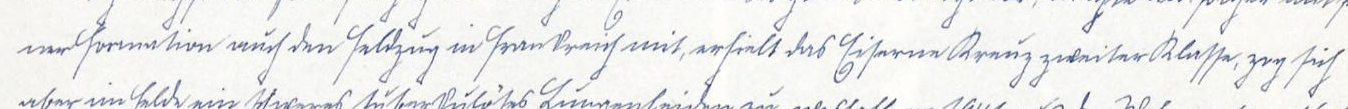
im Formation auch den Feldzug in Frankreich mit, erhielt das Eiserne Kreuz zweiter Klasse, zog sich
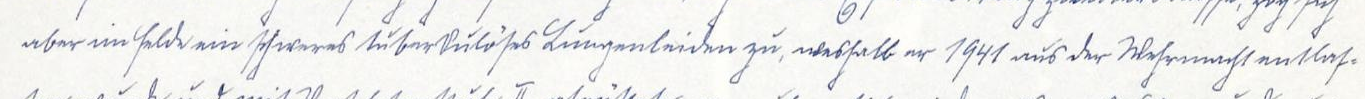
aber im Felde ein schweres tuberkulöses Lungenleiden zu, weshalb er 1941 aus der Wehrmacht entla-
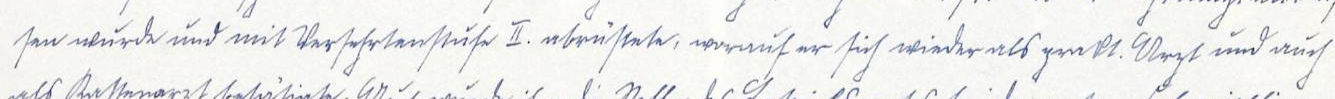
sen wurde und mit Versehrtenstufe II. abrüstete, worauf er sich wieder als prakt. Arzt und auch
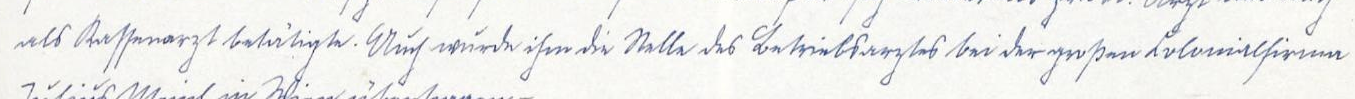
als Kassenerzt betätigte. Auch wurde ihm die Stelle des Betriebsarztes bei der großen Kolonialfirma
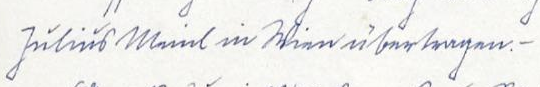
Julius Meinl in Wien übertragen.
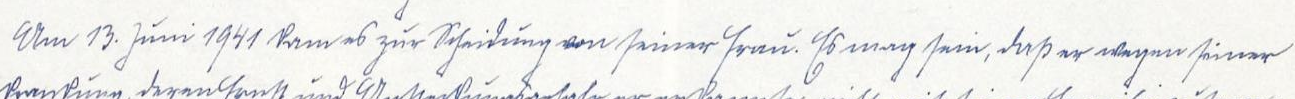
Am 13. Juni 1941 kam es zur Scheidung von seiner Frau. Es mag sein, das er wegen seiner
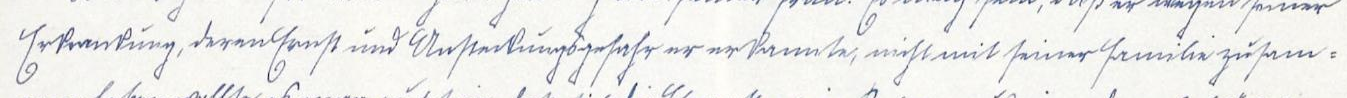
Erkrankung, deren Ernst und Ansteckungsgefahr er erkannte, nicht mit seiner Familie zusam-
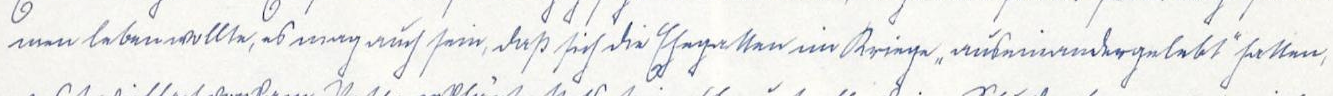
men leben wollte, es mag auch sein, dass sich die Ehegatten im Kriege auseinandergelebt hatten,
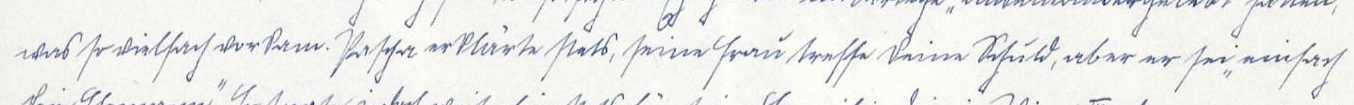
was so vielfach vorkam. Pascha erklärt stets, seine Frau treffe keine Schuld, aber er sei einfach
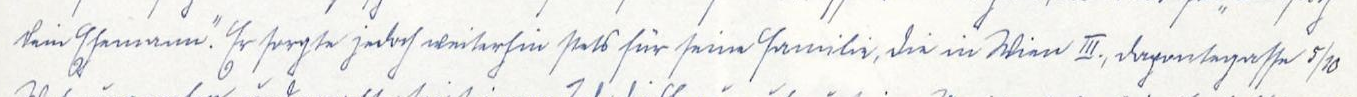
kein Ehemann. Er sorgte jedoch weiterhin stets für seine Familie, die in Wien III, Dapontegasse 5/10
